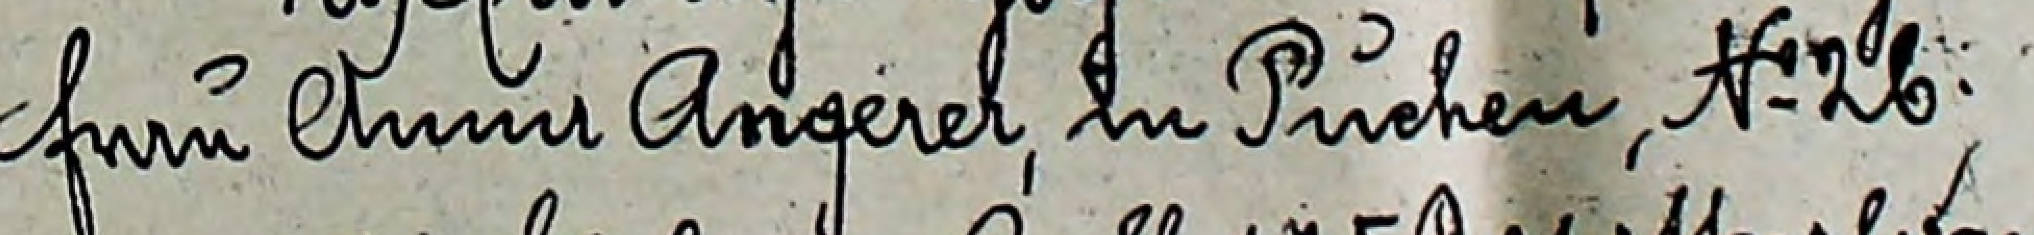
Frau Anna Angerer, in Puchen, No 26;
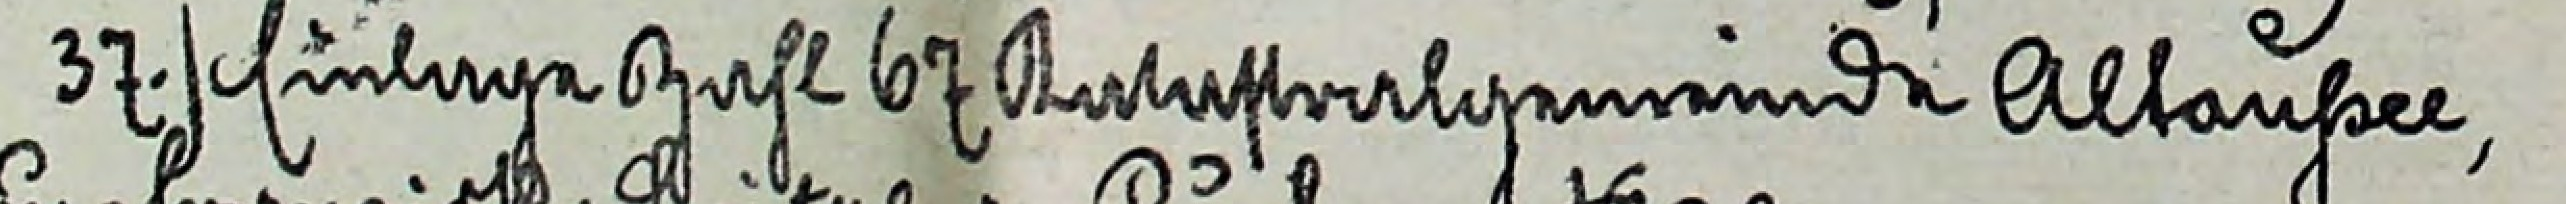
37.) Einlage - Zahl 67 Katastralgemeinde Altaussee,
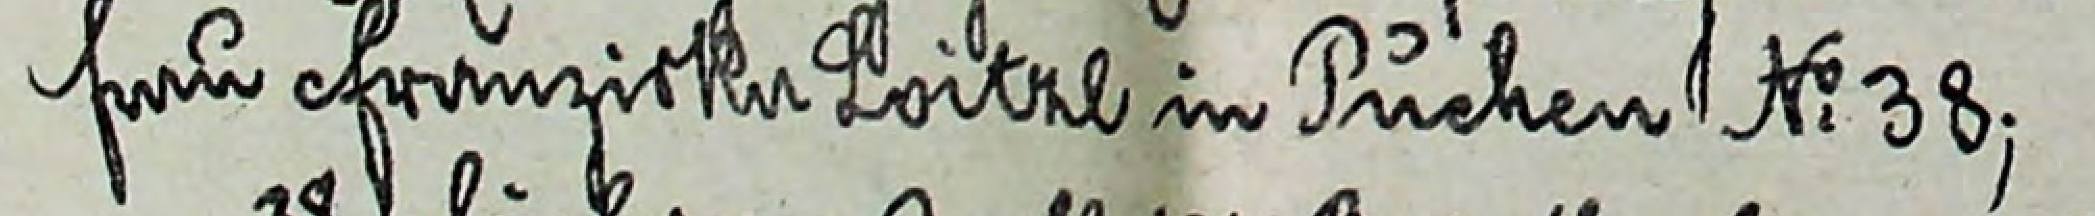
Frau Franziska Loitzl in Puchen No 38;
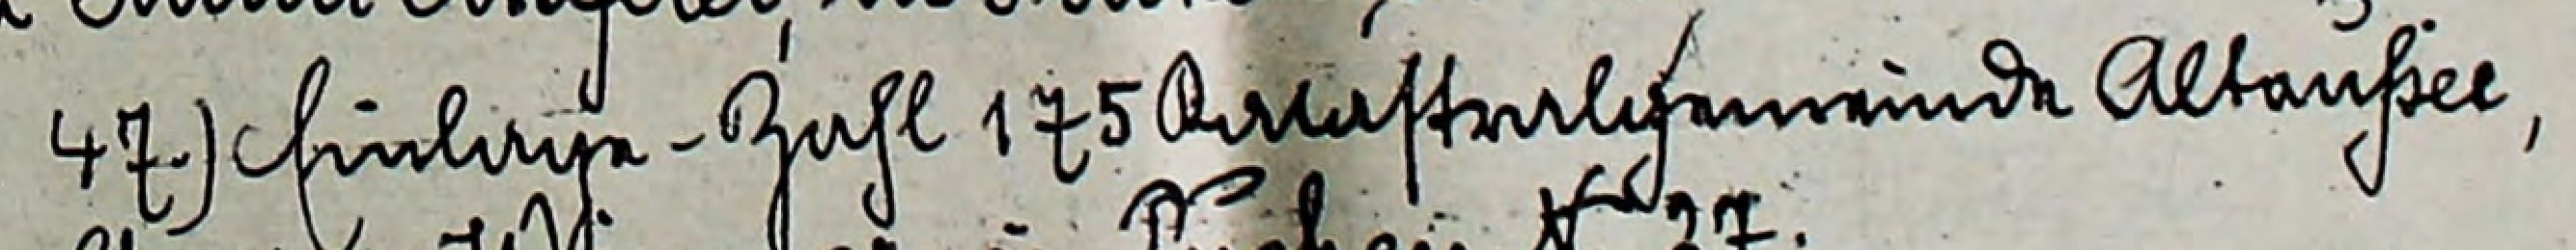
47.) Einlage - Zahl 175 Katastralgemeinde Altaussee,
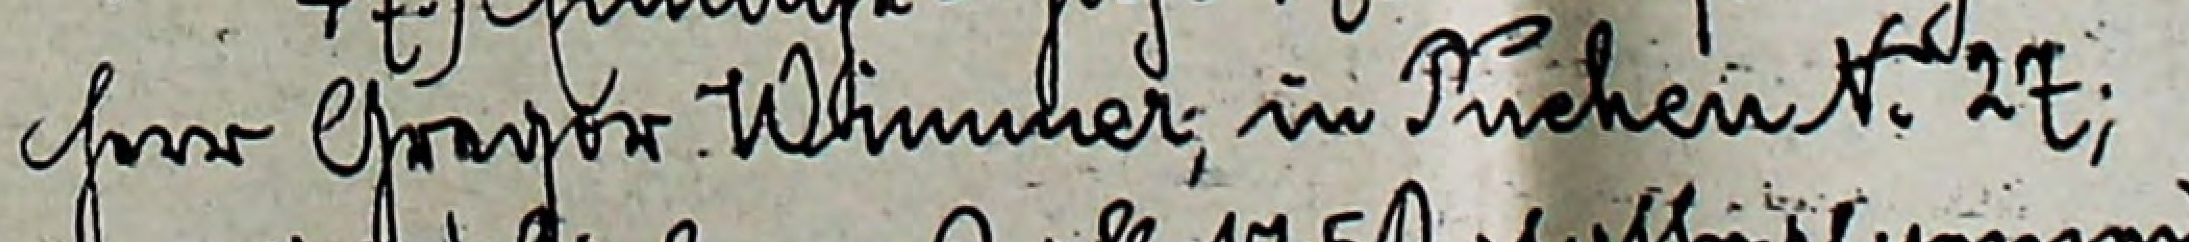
Herr Gregor Wimmer, in Puchen No 27;
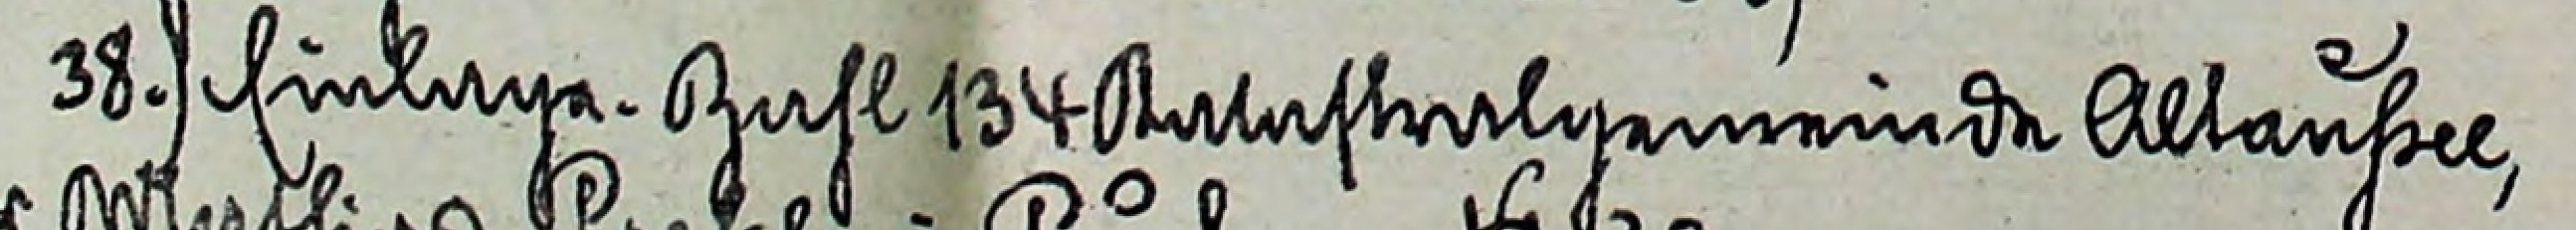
38.) Einlage - Zahl 134 Katastralgemeinde Altaussee,
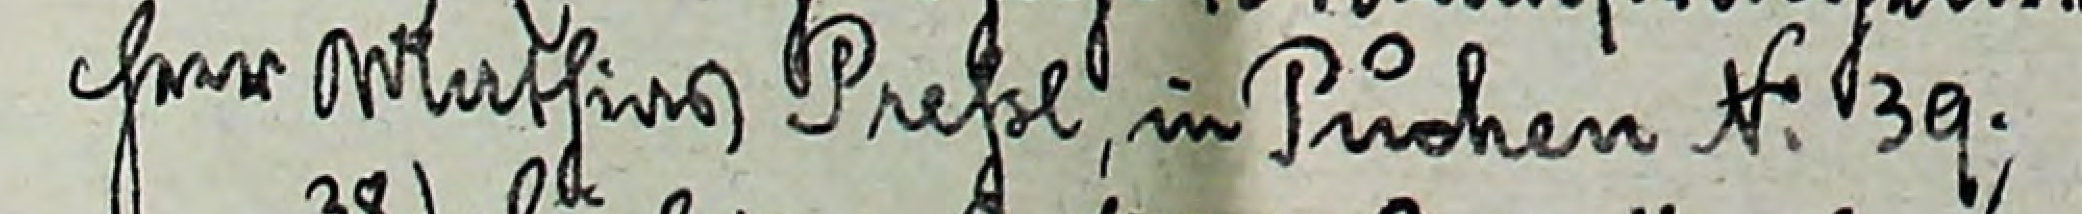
Herr Mathias Pressl, in Puchen No 39;
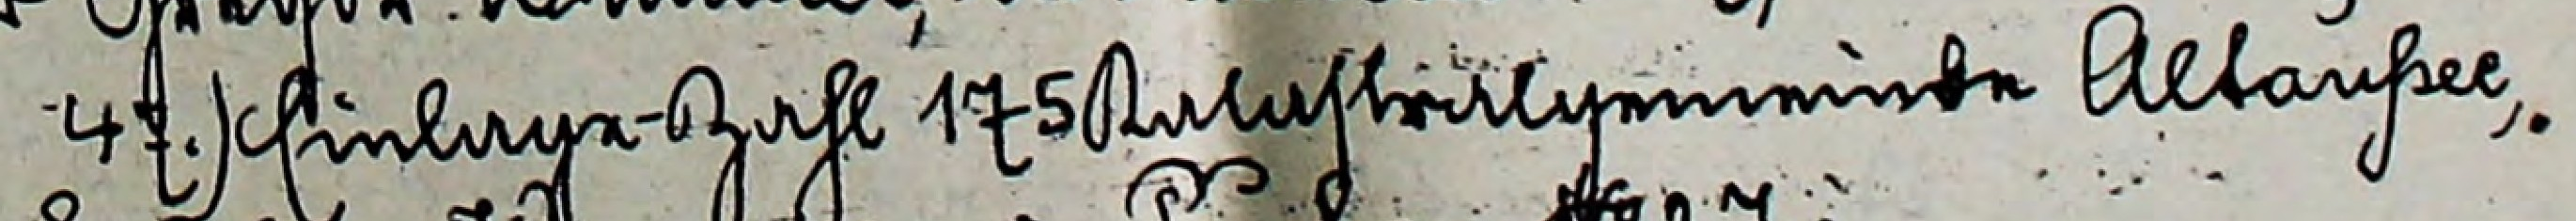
47.) Einlage - Zahl 175Katastralgemeinde Altaussee,
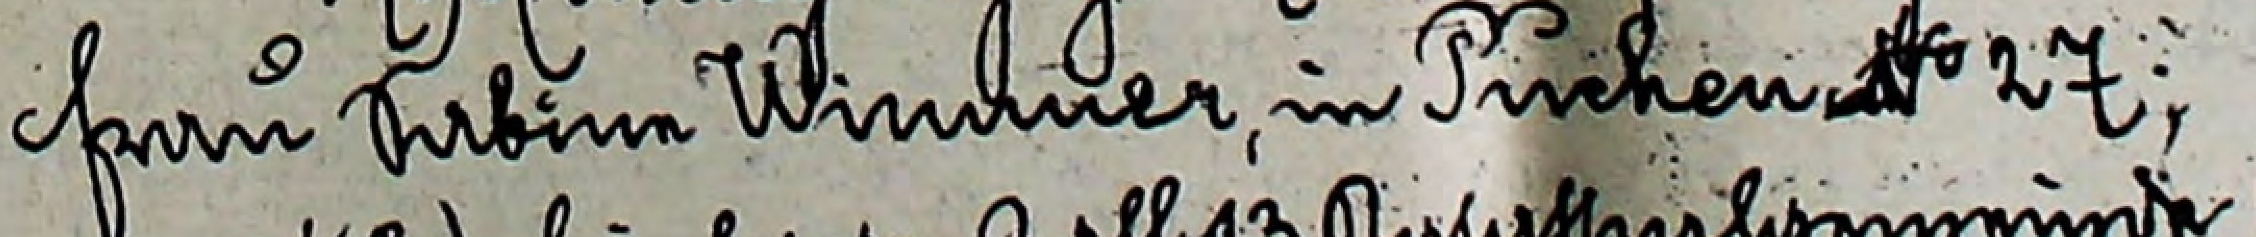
Frau Sabine Wimmer, in Puchen No 27;
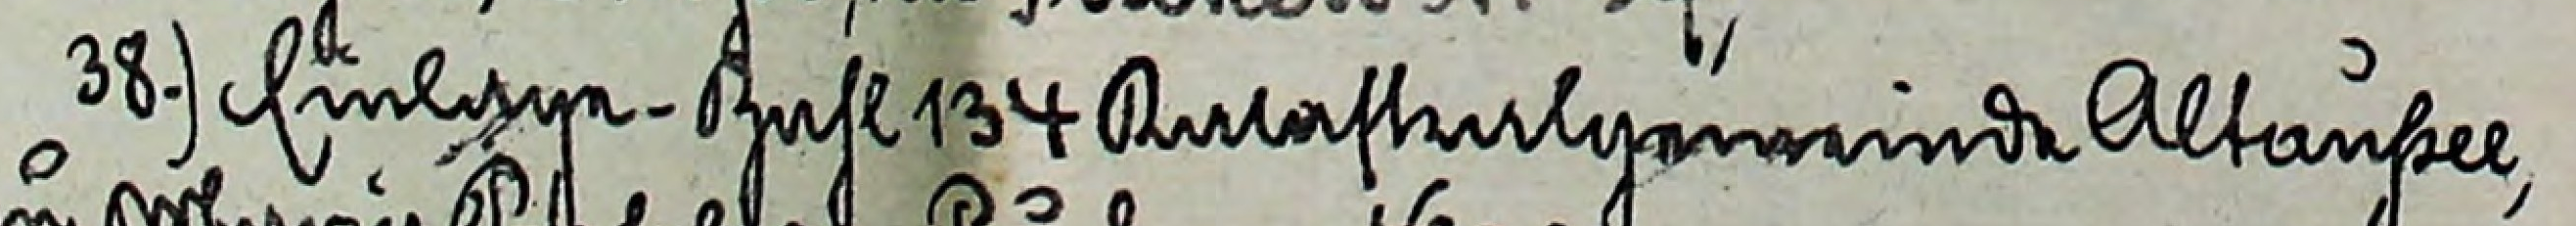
38.) Einlage - Zahl 134 Katastralgemeinde Altaussee,
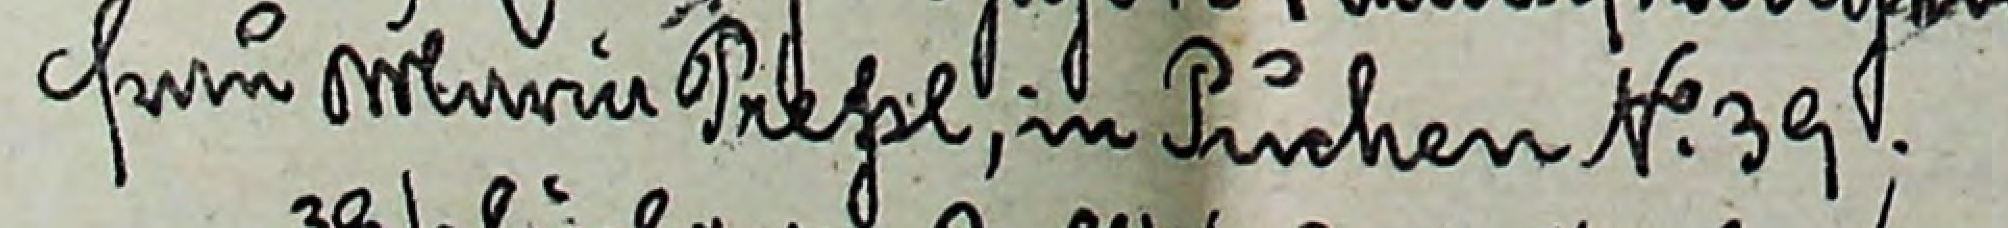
Frau Maria Pressl, in Puchen No 39;
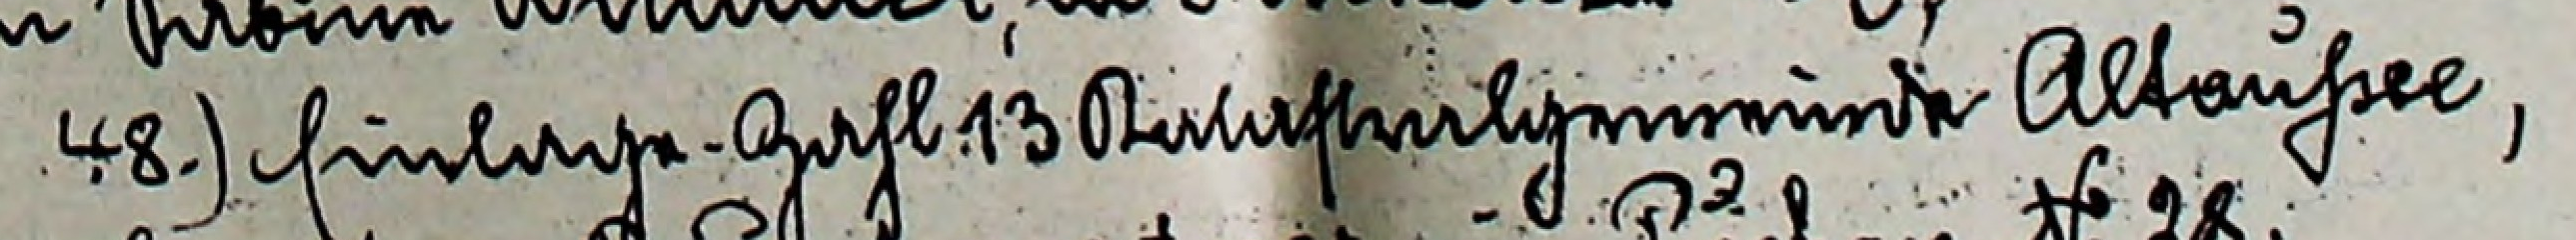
48.) Einlage - Zahl 13 Katastralgemeinde Altaussee,
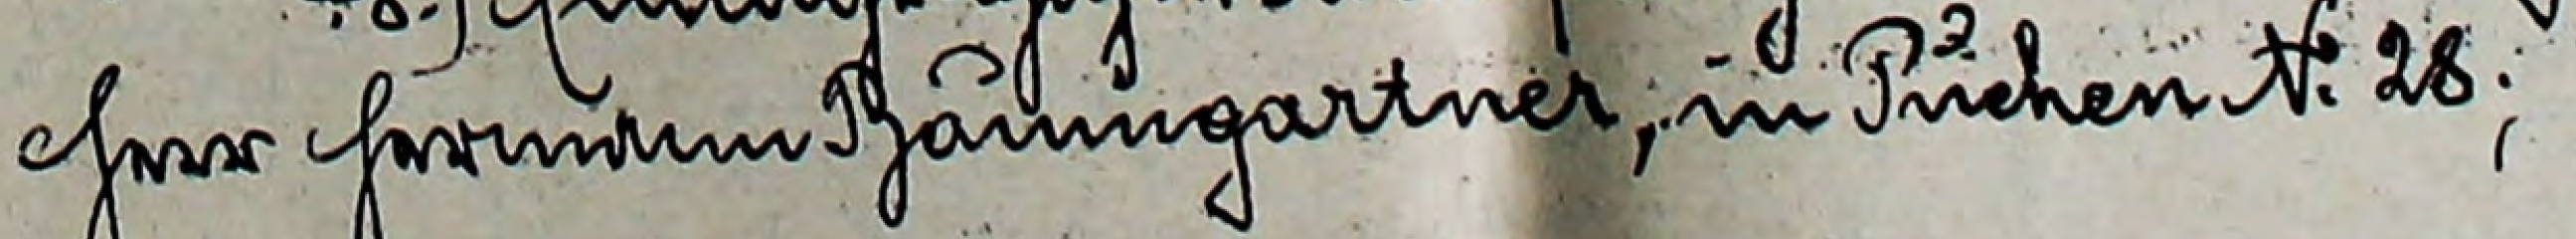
Herr Hermann Baumgartner, in Puchen No 28;
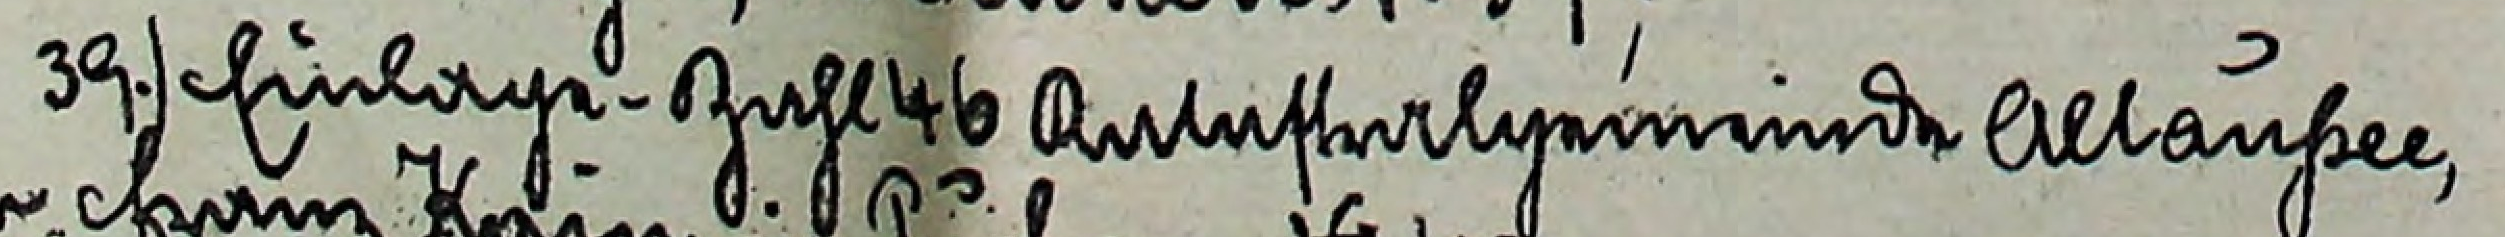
39.) Einlage - Zahl 46 Katastralgemeinde Altaussee,
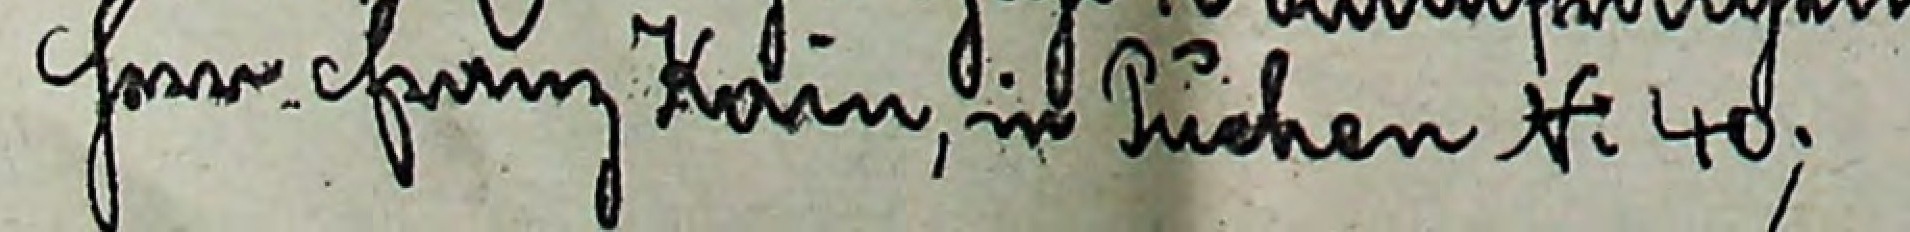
Herr Franz Kain, in Puchen No 40;
